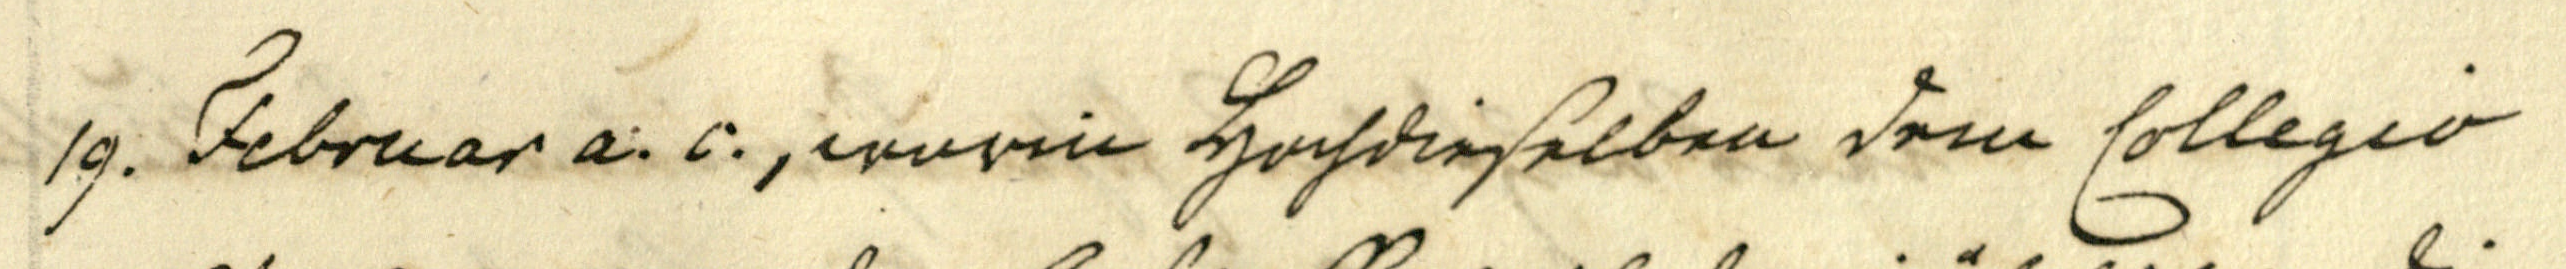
19. Februar a. c., worin Hochdieselben dem Collegio
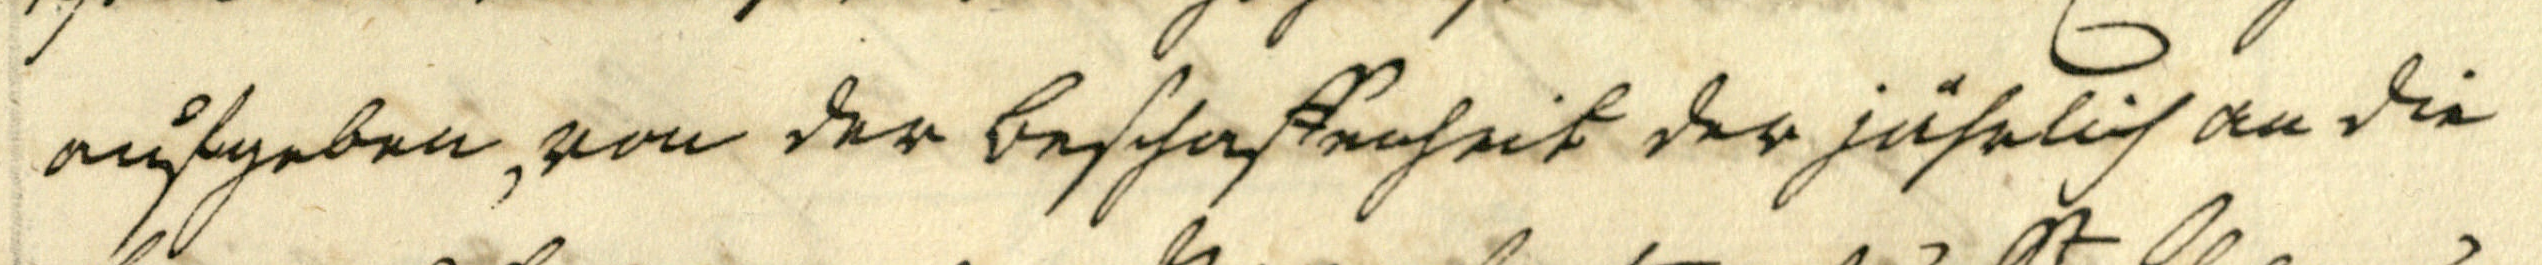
aufgeben, von der Beschaffenheit der jährlich an die
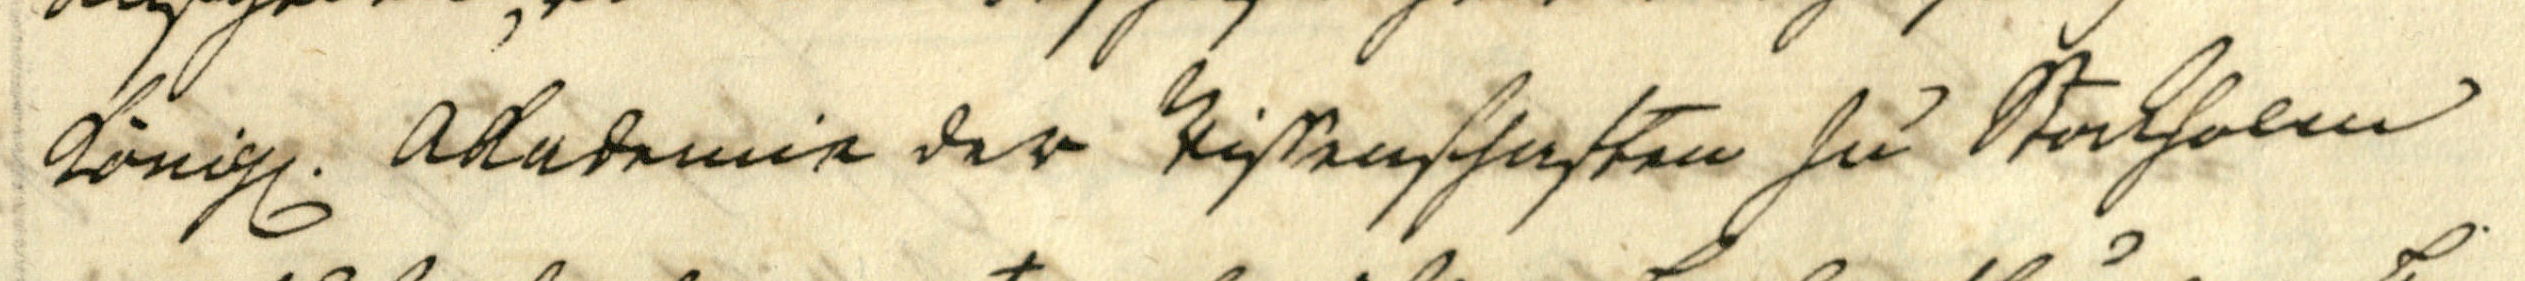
Königl. Akademie der Wissenschaften zu Stockholm
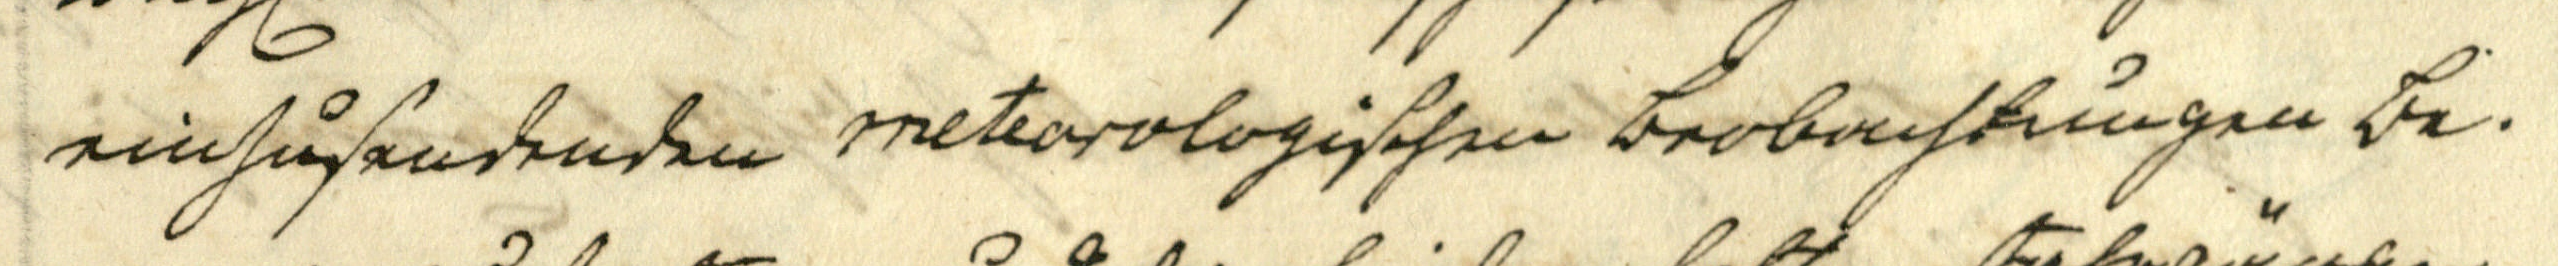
einzusendenden meteorologischen Beobachtungen Be¬
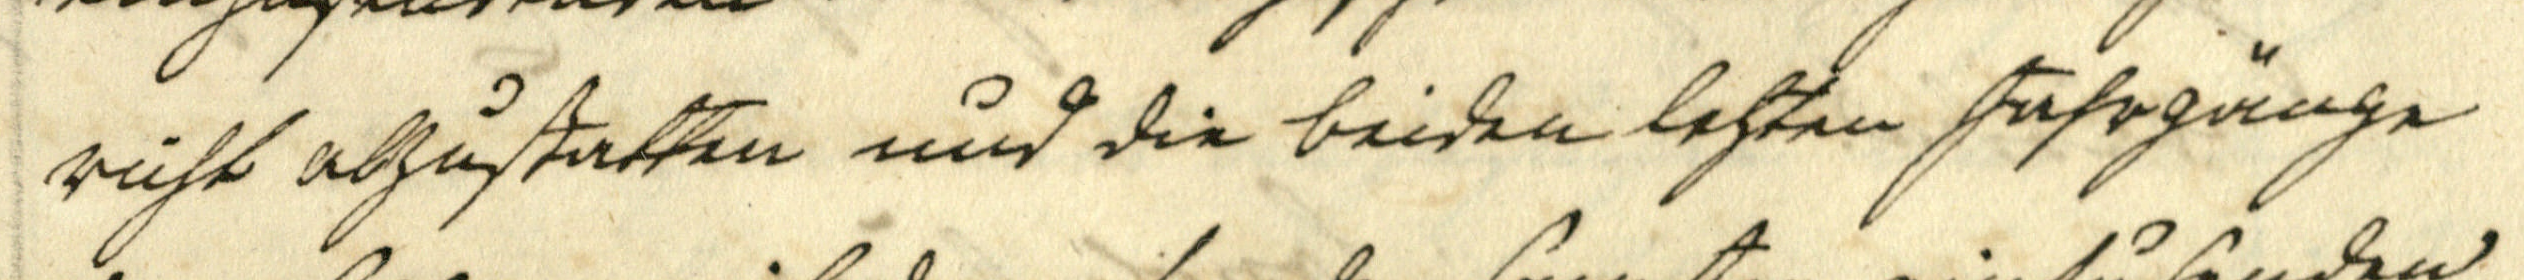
richt abzustatten und die beiden letzten Jahrgänge
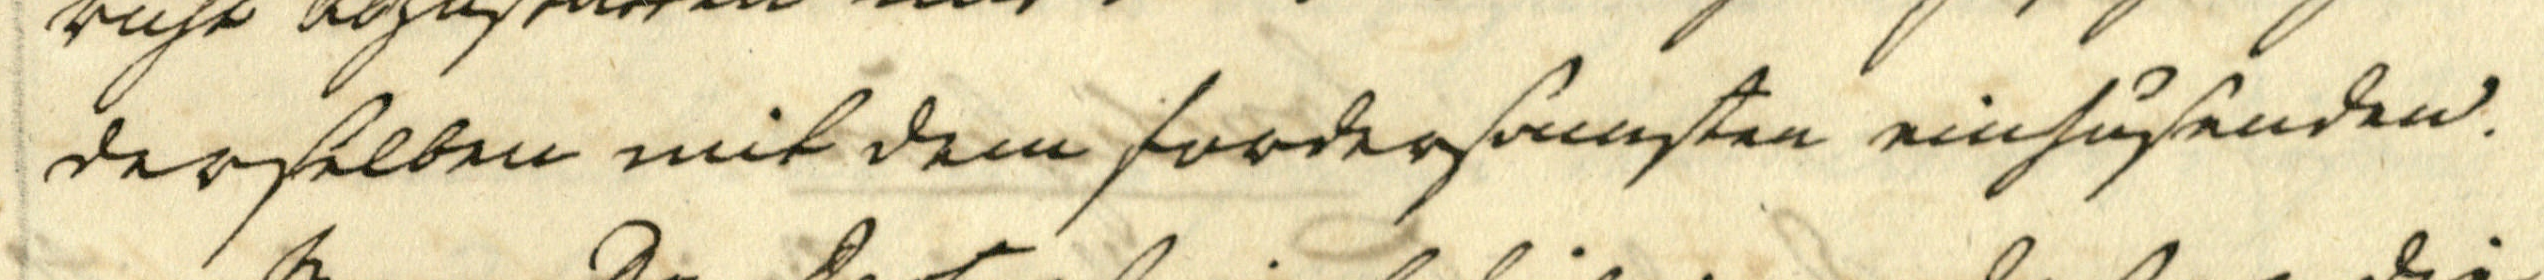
derselben mit dem fordersamsten einzusenden.
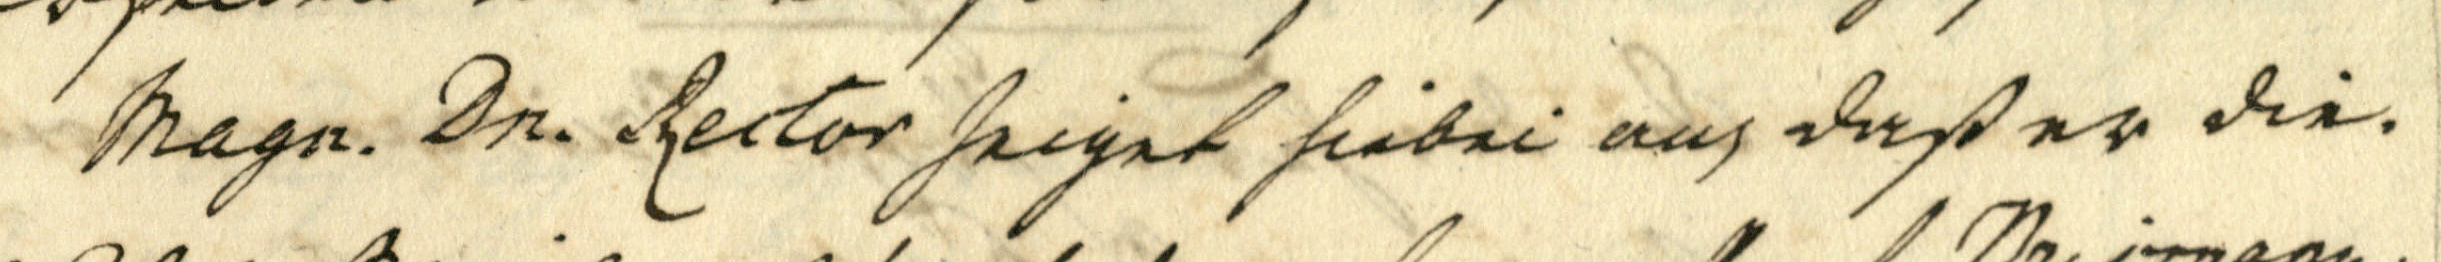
Magn. Dn. Rector zeiget hiebei an, daß er die¬
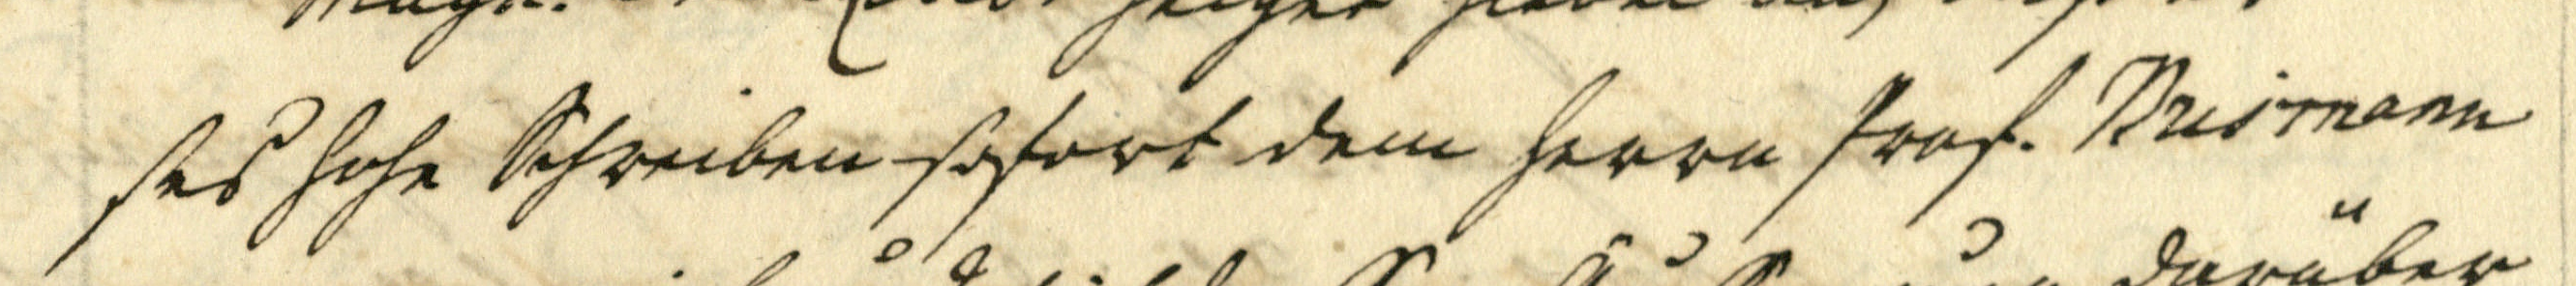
ses hohe Schreiben sofort dem Herrn Prof. Brismann
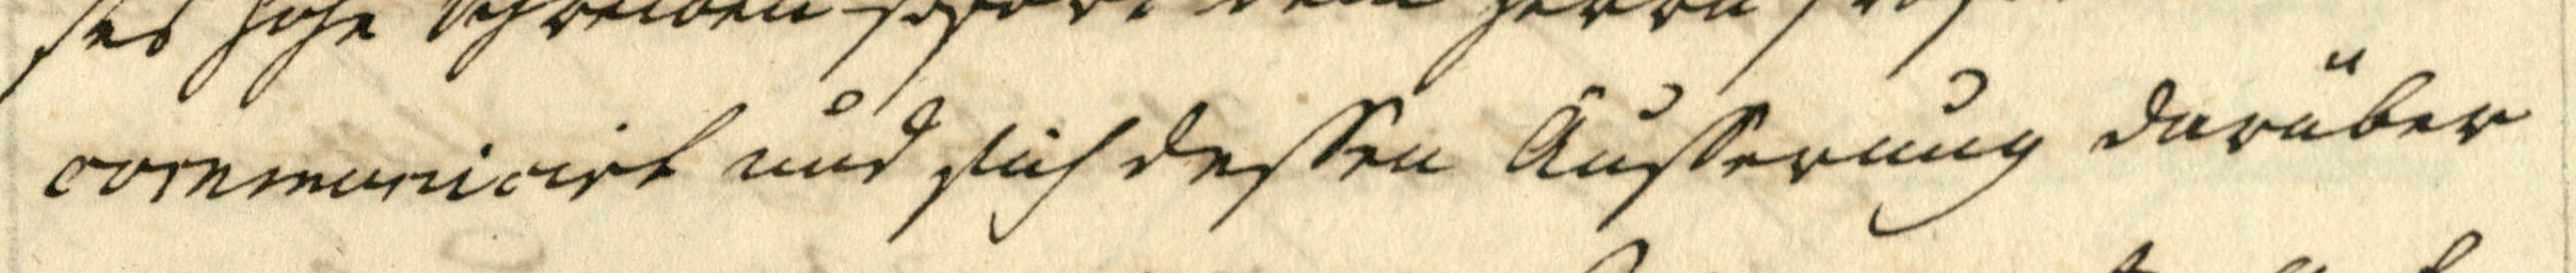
communicirt und sich dessen Äusserung darüber
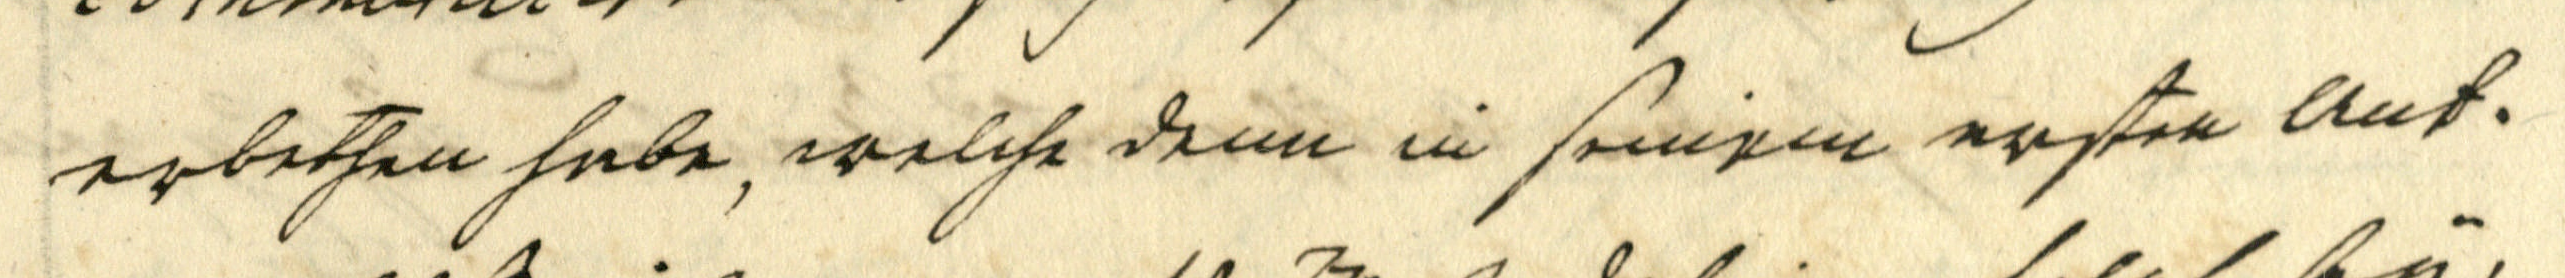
erbethen habe, welche denn in seinem ersten Ant¬
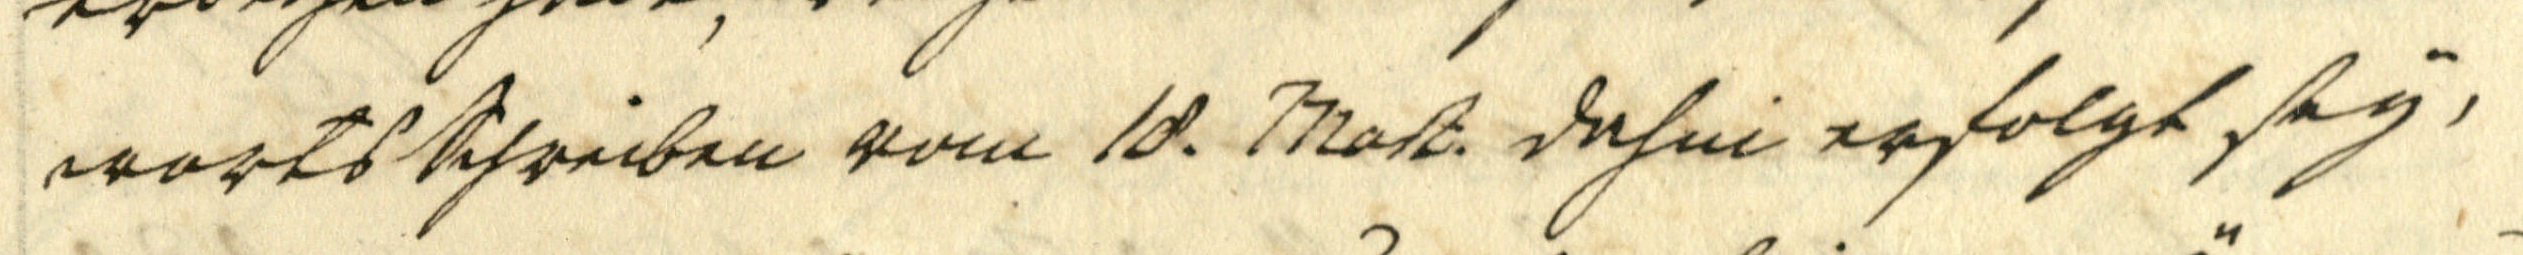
worts Schreiben vom 18. Mart. dahin erfolgt seÿ,
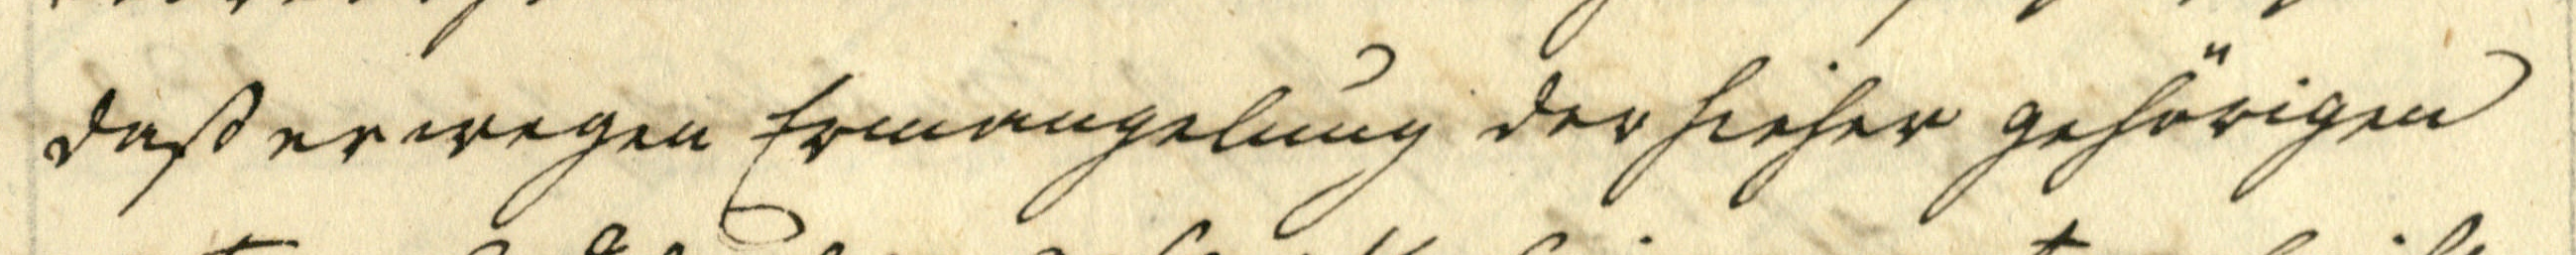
daß er wegen Ermangelung der hieher gehörigen
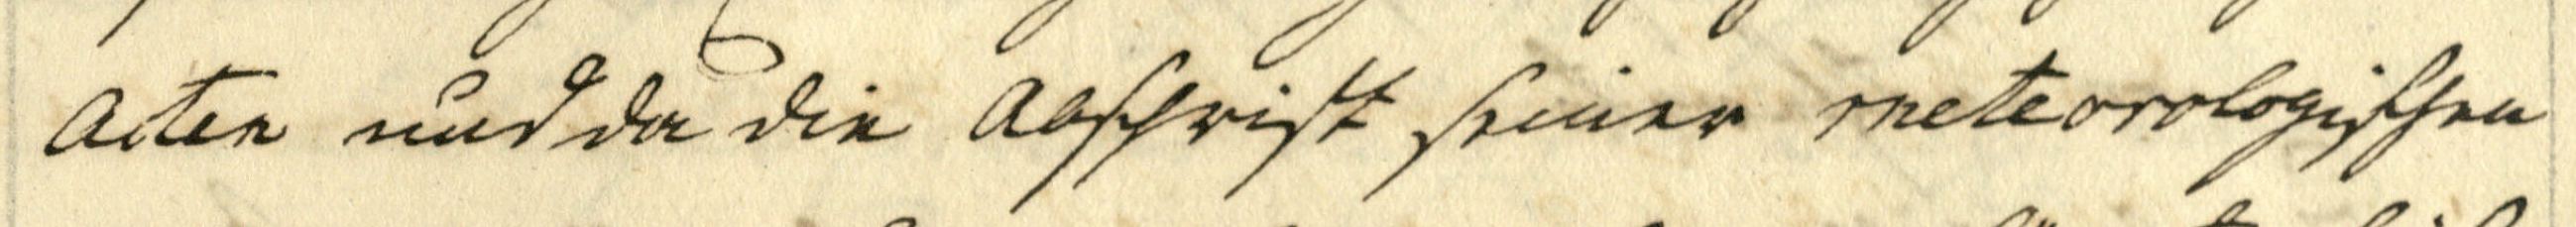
Acten und da die Abschrift seiner meteorologischen
